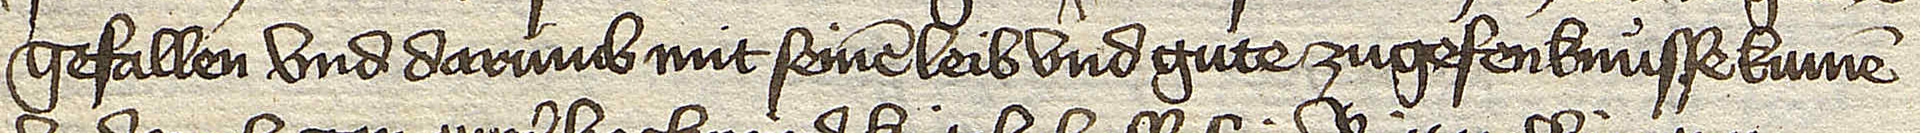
gefallen vnd darümb mit ſeine* lieb vnd gute cʒugefenknüſſe kume*
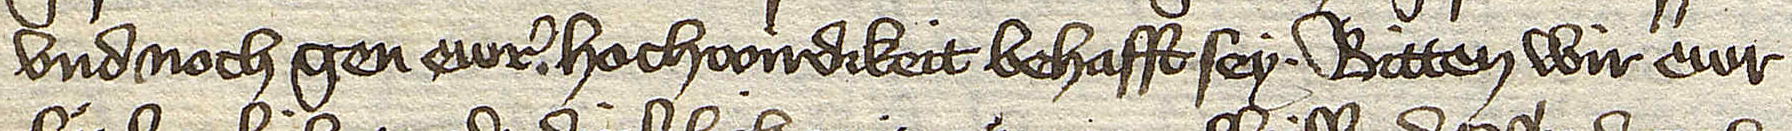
vnd noch gen ewr* hochwirdikeit behafft ſey . Bitten wir ewr
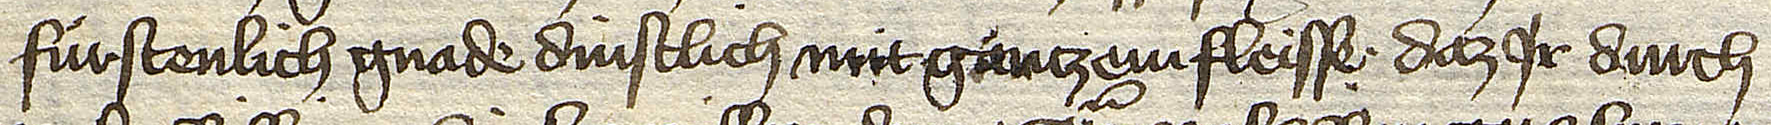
fürſtenlich gnade dinſtlich mit gancʒem fleiſſe . daʒ Ir durch
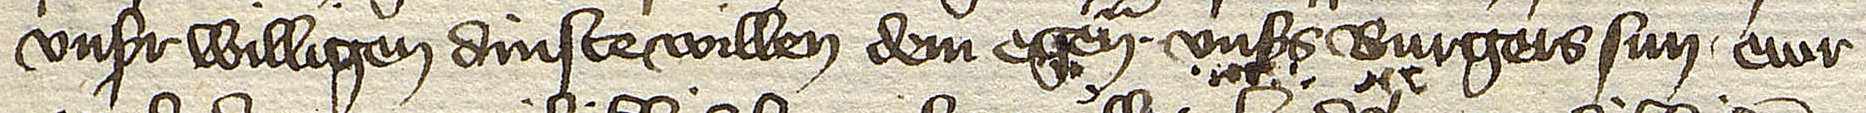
vnſ*r willigen dinſte willen dem egen* ~ vnſ*s Burgers ſun / ewr
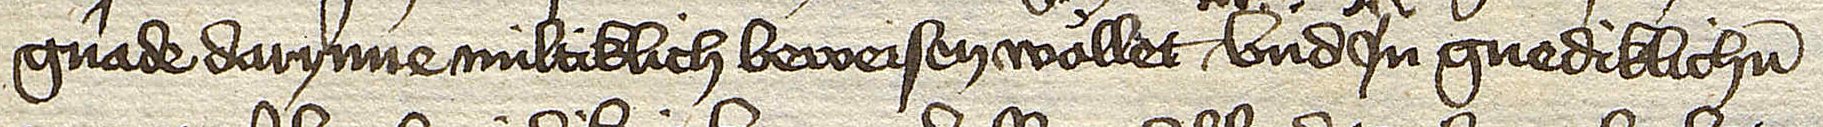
gnade darynne miltiklich beweiſen wöllet / vnd In gnediklichn*
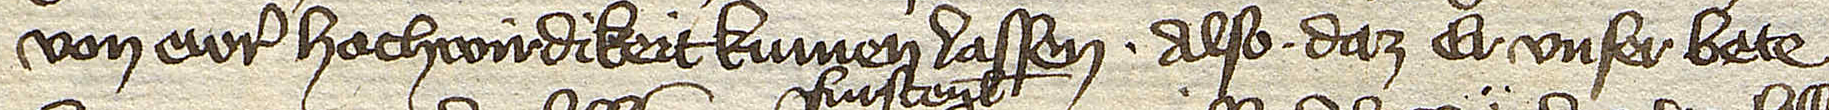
von ewr* hochwirdikeit kumen laſſen . Alſo . daʒ Er vnſer bete
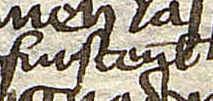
furſtenl*
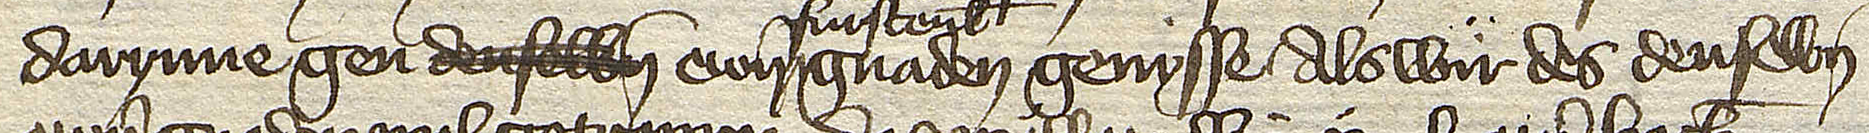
darynne gen denſelbn* ewn* gnaden genyſſe / Als wir des denſelbn*
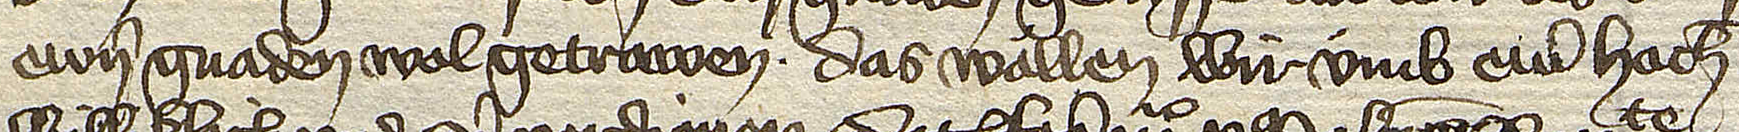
ewn* gnaden wol getrawen . das wöllen wir v̈mb ew* hoch*
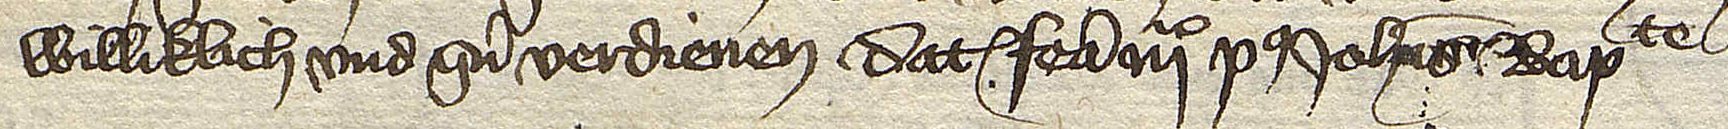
williklich vnd gn* verdienen / dat* fea* iii* p* Iohan*s Bap*
